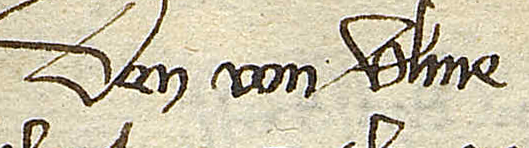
Den von Vlme
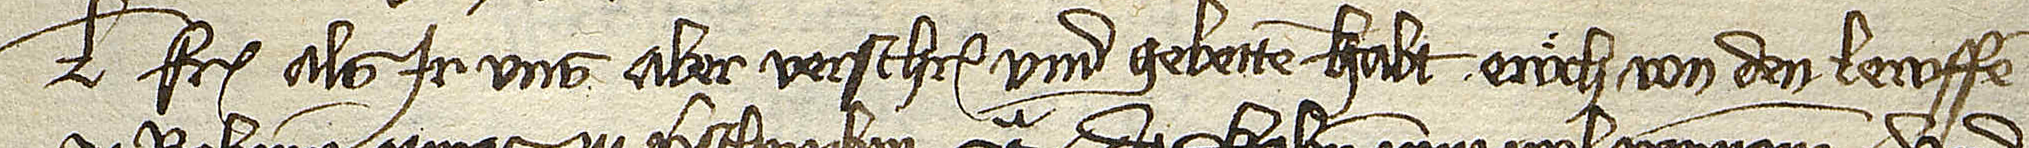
L* fr* als Ir vns aber verſchr* vnd gebette* habt . eẅch von den lewffe*
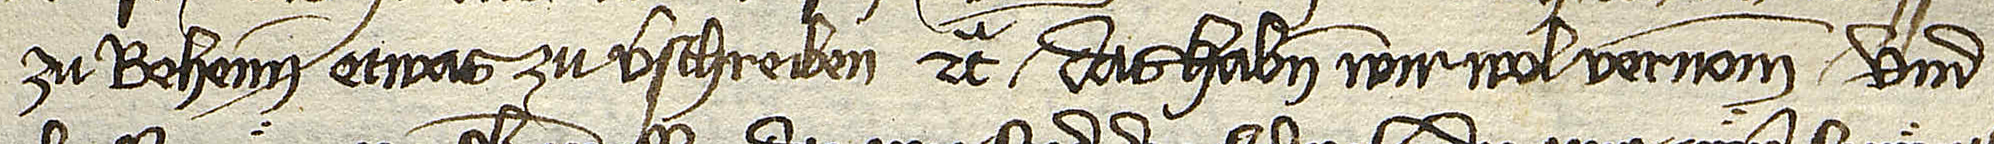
ʒu Beheim etwas ʒu v*ſchreiben ec* / Das habn* wir wol vernom* / Vnd
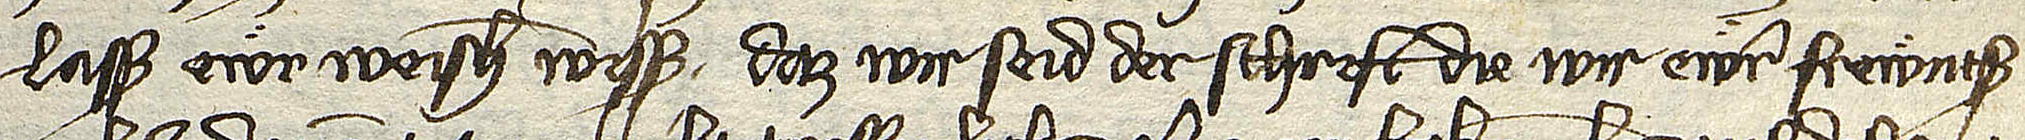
laſſ* eẅr weiſh* wiſſ* / daʒ wir ſeid der ſchrift die wir eẅr* freẅntſ*
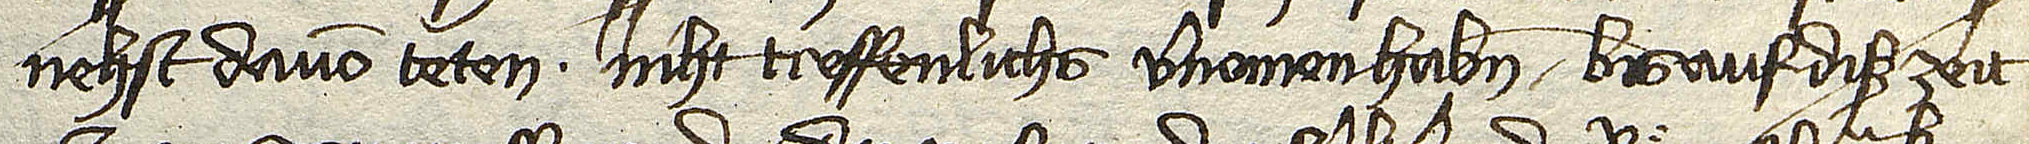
nehſt dauo* teten . niht treffenlichs v*nomen habn* / bis auf diſʒ ʒeit
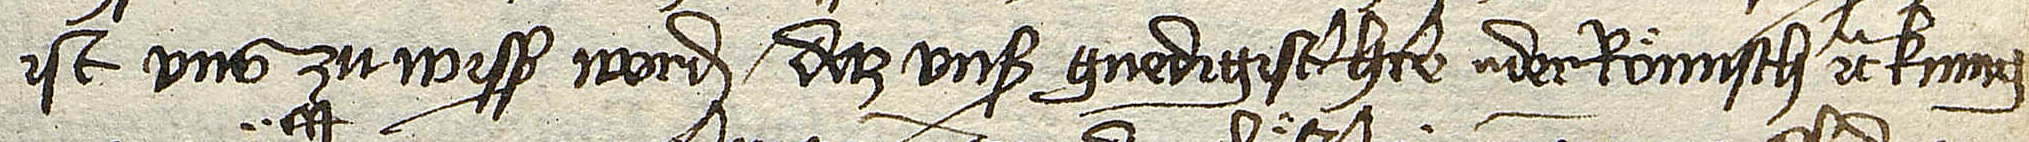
iſt vns ʒu wiſſ* word* / daʒ vnſ* gnedigiſt* h*re ~ der Römiſch ec* kunig
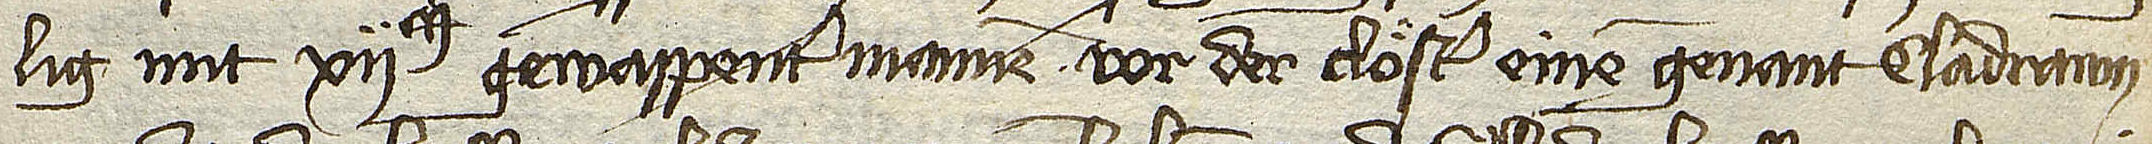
lig mit xii* gewappent* manne* . vor der clöſt* eine* genant Cladrawn
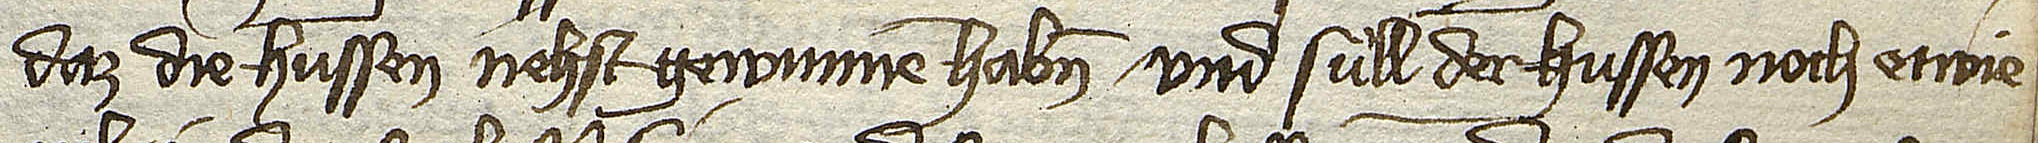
daʒ die huſſen nehſt gewunne* habn* / vnd ſüll der huſſen noch etwie
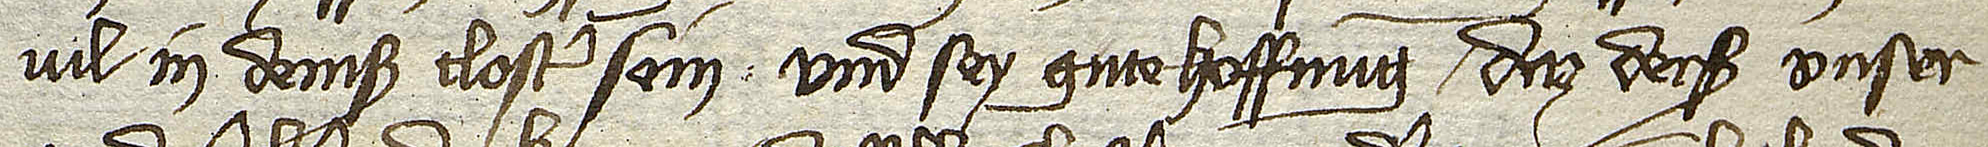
uil in demſ* cloſt* ſein vnd ſey gute hoffnu*g / daʒ derſ* vnſer
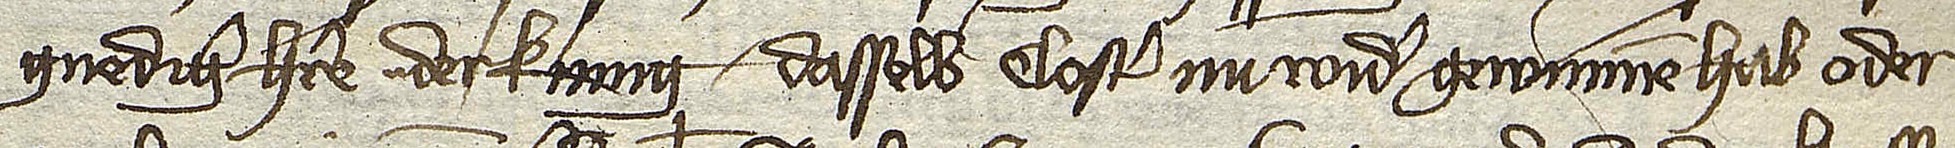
gnedig* h*re ~ der kunig / daſſelb Cloſt* nu wid* gewunne* hab oder
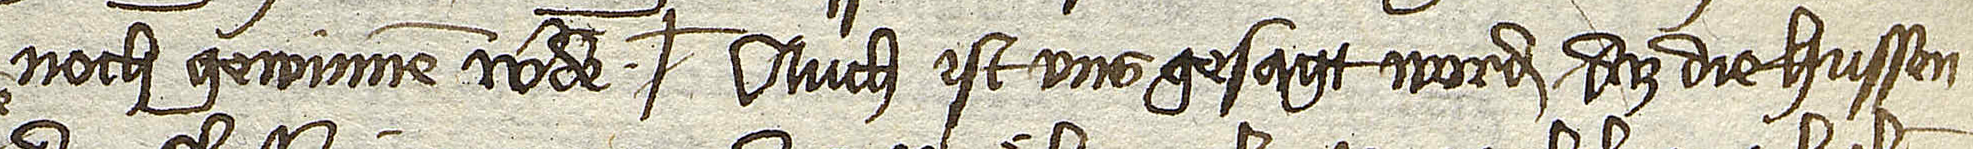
noch gewinne* w*de / Auch iſt vns geſagt word* / daʒ die huſſen
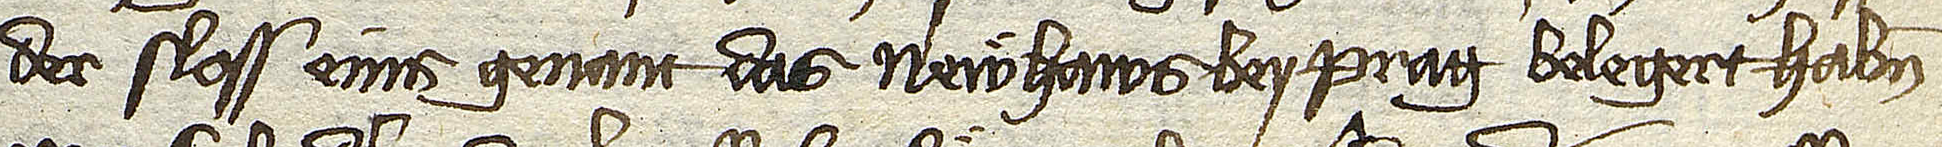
der ſloſſ eins genant das Neẅhaws bey Prag belegert habn*
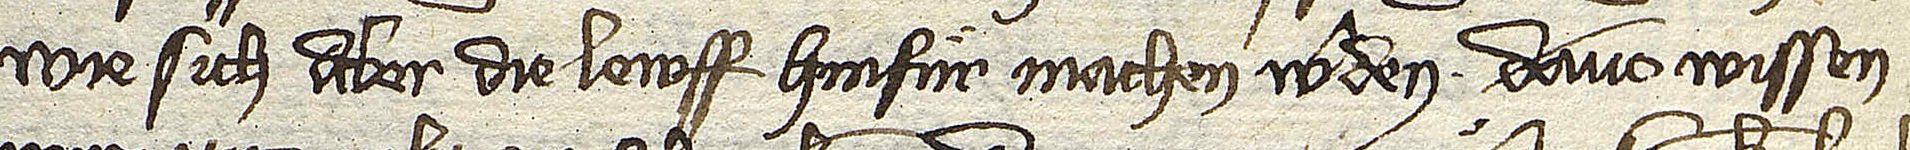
wie ſich aber die lewff hinfür machen w*den . Dauo* wiſſen
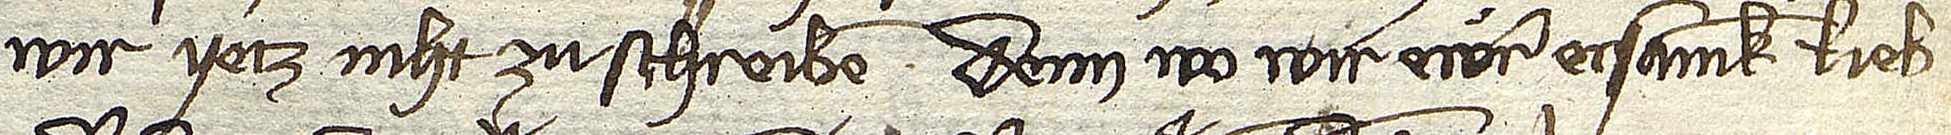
wir yecʒ niht ʒuſchreibe* . Denn wo wir eẅr* erſamk* lieb
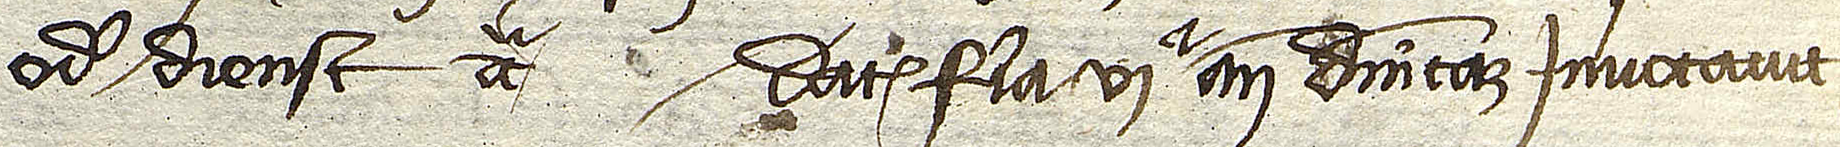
od* dienſt ec* / Dat* fi*a vi* an* d*nica* Inuocauit
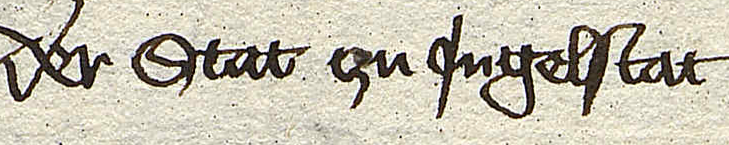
Der Stat cʒu Ingelſtat
